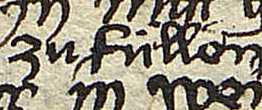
ʒu füllen
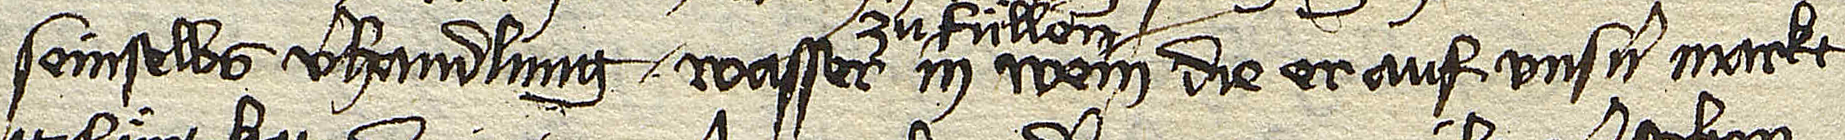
ſeinſelbs v*handlung / waſſer in wein die er auf vnſn* markt
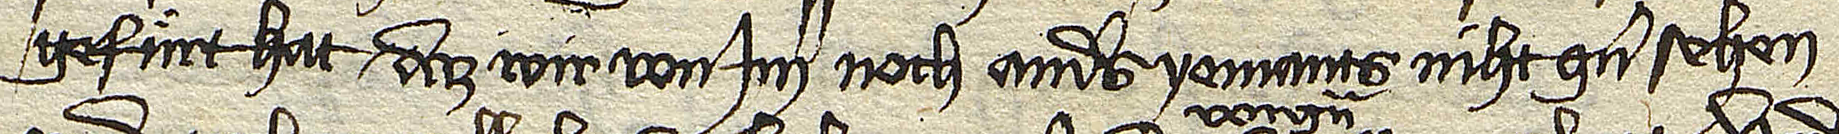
gefürt hat / daʒ wir von Im noch and*s yemants niht gn* ſehen
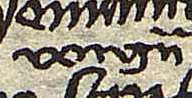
vorgn*
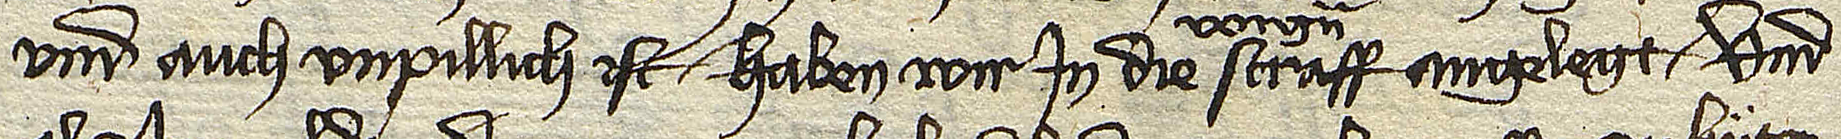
vnd auch vnpillich iſt / haben wir In die ſtraff angelegt / Vnd
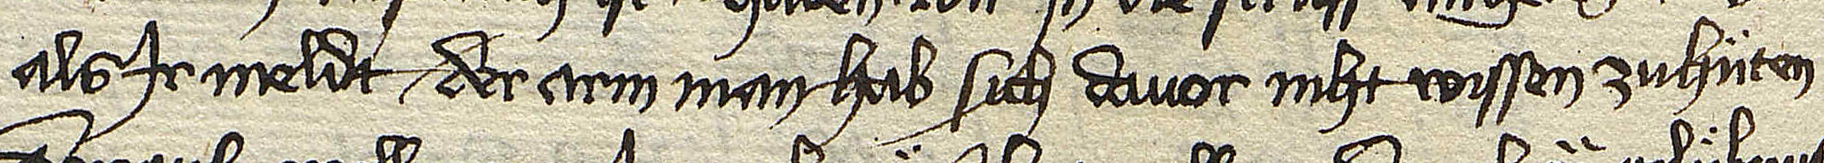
als Ir meldt / der arm man hab ſich dauor niht wiſſen ʒuhüten
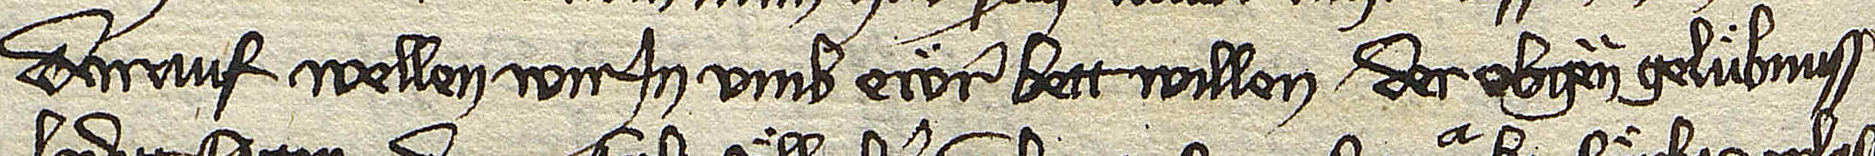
Darauf wellen wir In vmb ewr* bett willen / der obgen* gelübnuſſ
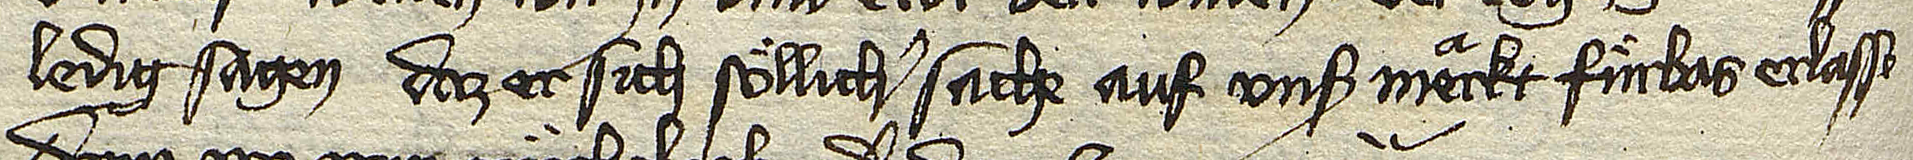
ledig ſagen daʒ er ſich ſöllich* ſache auf vnſ* mërkt* fürbas erlaſſe
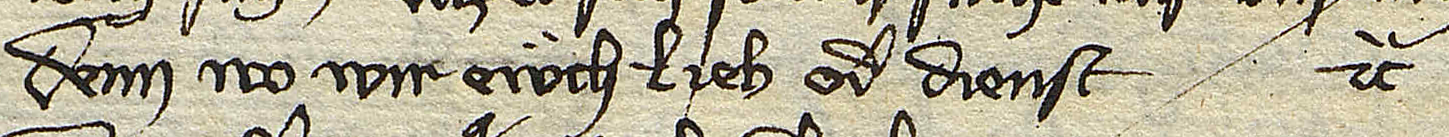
Denn wo wir ewch lieb od* dienſt ec*
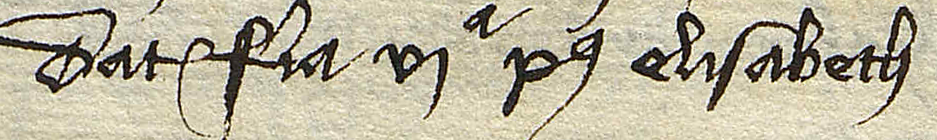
Dat* fi*a vi* p* eliſabeth
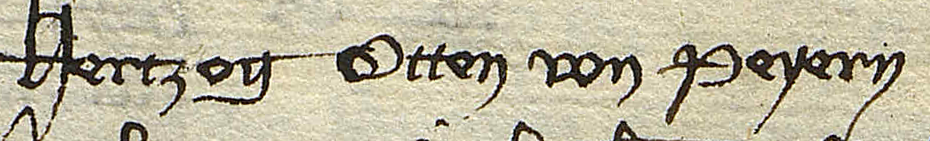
Hercʒog Otten von Peyern
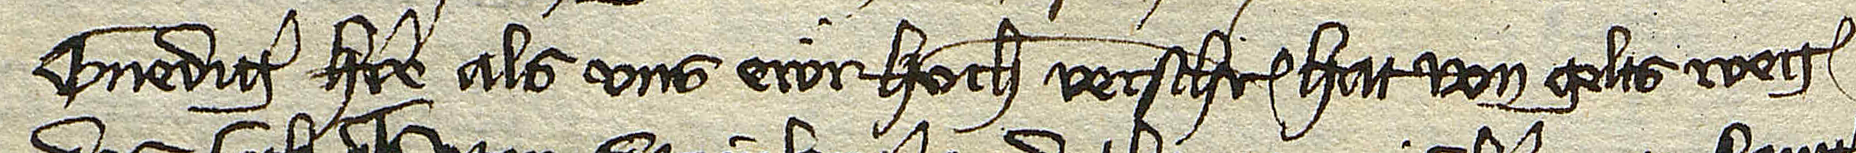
Gnedig* Hr*e als vns ewr hoch* verſchr* hat von gelts weg*
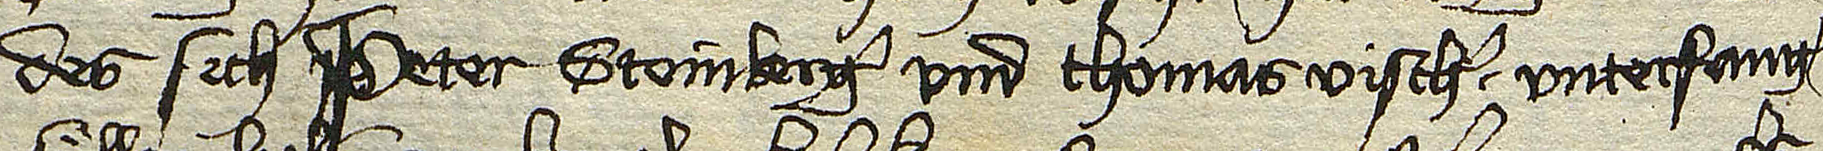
des ſich Peter Steinberg* vnd thomas viſch* vnterfang*
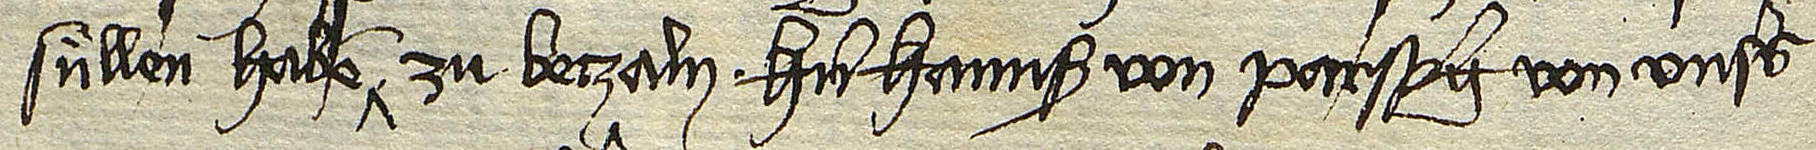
ſüllen habe* ʒu becʒaln . Hn* Hannſ* von parſp*g von vnſ*s
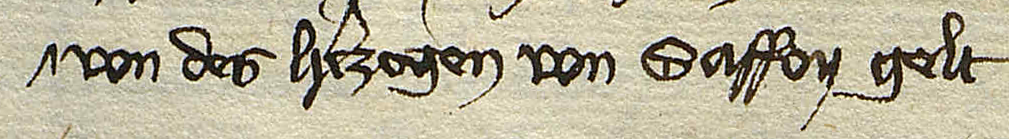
von des h*cʒogen von Saffoy gelt
